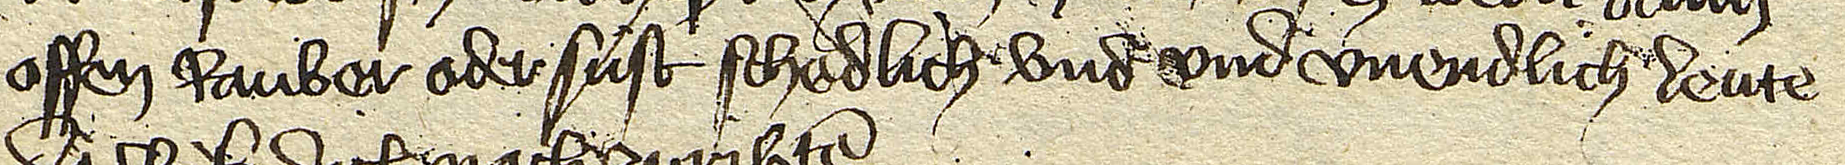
offen Rauber oder ſüſt ſchedlich vnd vnd vnendlich leute
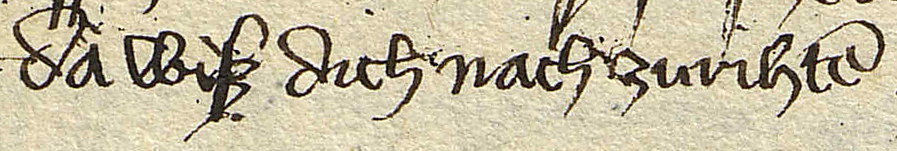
da wiſʒ dich nach cʒurihte*
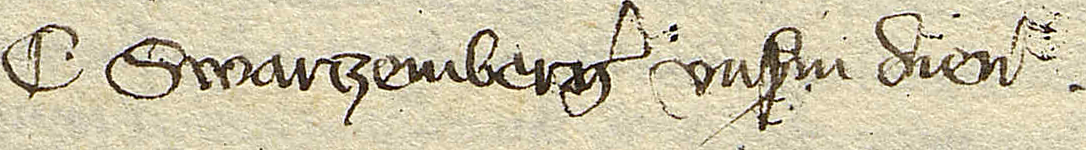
C Swarcʒemberg* vnſ*m dien*
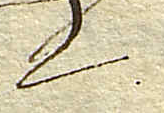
L*
